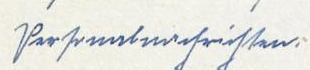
Personalnachrichten
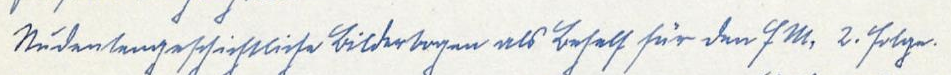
Studentengeschichtliche Bilderbogen als Behelf für den FM, 2. Folge
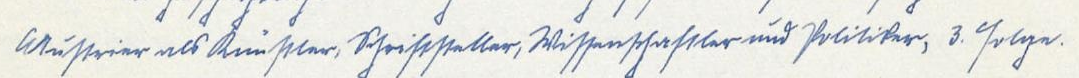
Austrier als Künstler, Schriftsteller, Wissenschaftler und Politiker, 3. Folge.
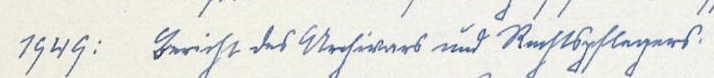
1949: Bericht des Archivars und Rechtspflegers
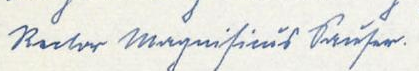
Rector magnificus Sauser
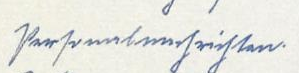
Personalnachrichten
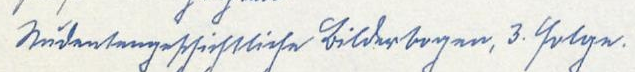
Studentengeschichtliche Bilderbogen, 3. Folge
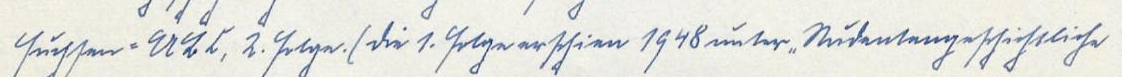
Fuchsen – A B C , 2 Folge (die 1. Folge erschien 1948 unter „Studentengeschichtliche
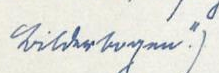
Bilderbogen.“)
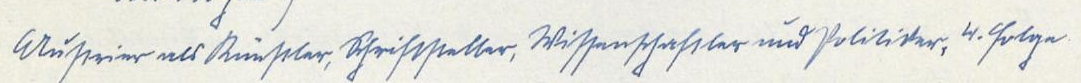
Austrier als Künstler, Schriftsteller, Wissenschaftler und Politiker, 4. Folge
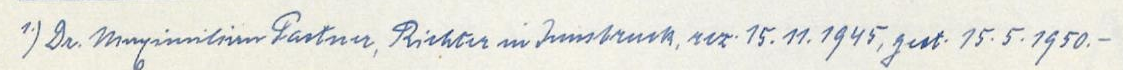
1) Dr. Maximilian Partner Richter in Innsbruck rez. 15.11.1945 gest. 15.5.1950
